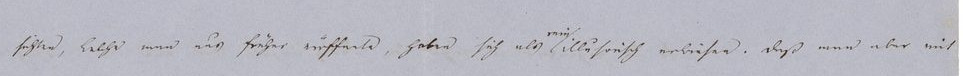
sichten, welche man uns früher eröffnete, haben sich als rein illusorisch erwiesen. Daß man aber mit
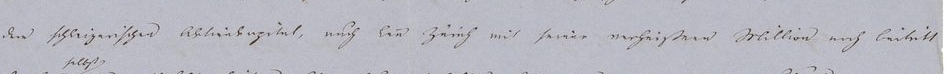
dem schweizerischen Aktienkapital, auch wenn Zürich mit seiner verheißnen Million noch beitritt
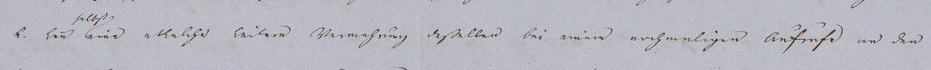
u. wenn selbst eine etwelche weitere Vermehrung deßelben bei einem nochmaligen Aufrufe an den
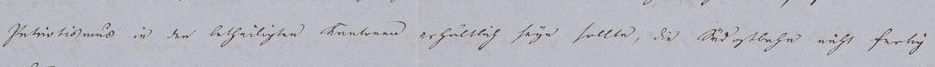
Patriotismus in den betheiligten Kantonen erhältlich seyn sollte, die Südostbahn nicht fertig
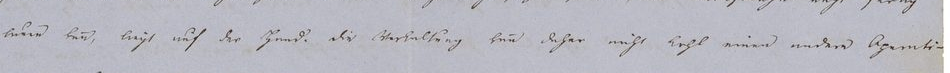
bauen kann, liegt auf der Hand. Die Verwaltung kann daher nicht wohl einen andern Operati-
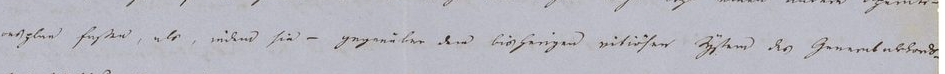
onsplan faßen, als, indem sie – gegenüber dem bisherigen vitiösen System des Generalakkords
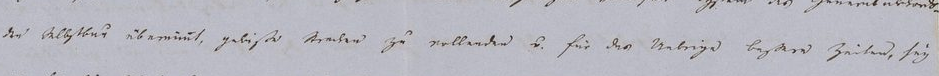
den Selbstbau übernimmt, gewiße Strecken zu vollenden u. für das Uebrige beßere Zeiten, sey
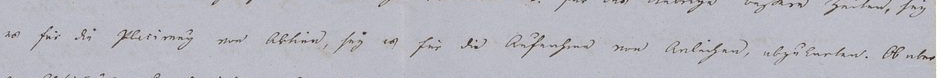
es für die Placirung von Aktien, sey es für die Aufnahme von Anleihen, abzuwarten. Ob aber
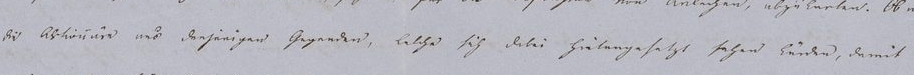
die Aktionnäre aus denjenigen Gegenden, welche sich dabei hintangesetzt sehen würden, damit
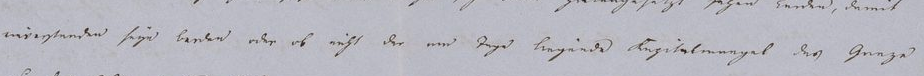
einverstanden seyn werden oder ob nicht der am Tage liegende Kapitalmangel das Ganze
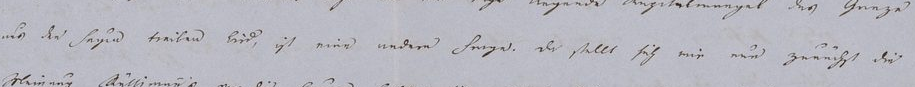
aus den Fugen treiben wird, ist eine andere Frage. Da stellt sich mir nun zunächst die
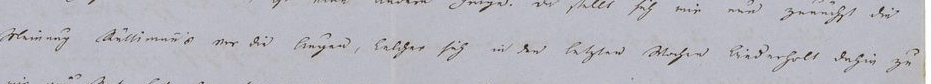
Meinung Rüttimann's vor die Augen, welcher sich in den letzten Wochen wiederholt dahin zu
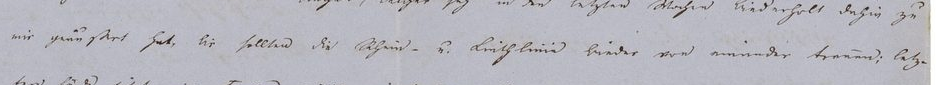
mir geäußert hat, wir sollten die Rhein- u. Linthlinie wieder von einander trennen; letz-
